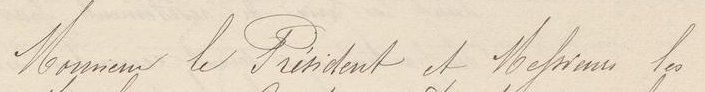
Monsieur le Président et Messieurs les
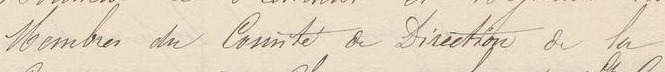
Membres du Comité de Direction de la
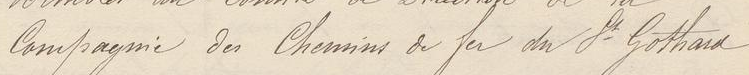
Compagnie des Chemins de fer du St Gothard
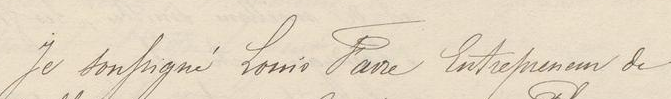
Je soussigné Louis Favre Entrepreneur de
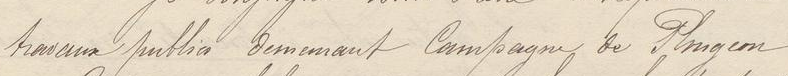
travaux publics demeurant Campagne de Plongeon
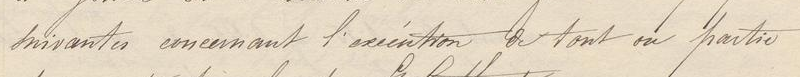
suivantes concernant l'exécution de tout ou partie
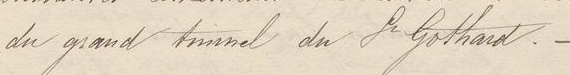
du grand tunnel du StGothard. –
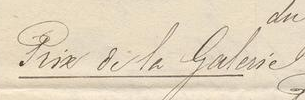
Prix de la Galerie
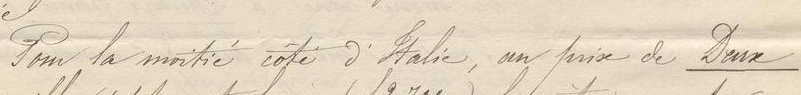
Pour la moitié côté d'Italie, au prix de Deux
